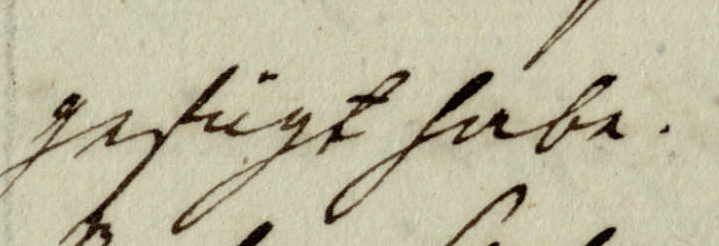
gefügt habe.
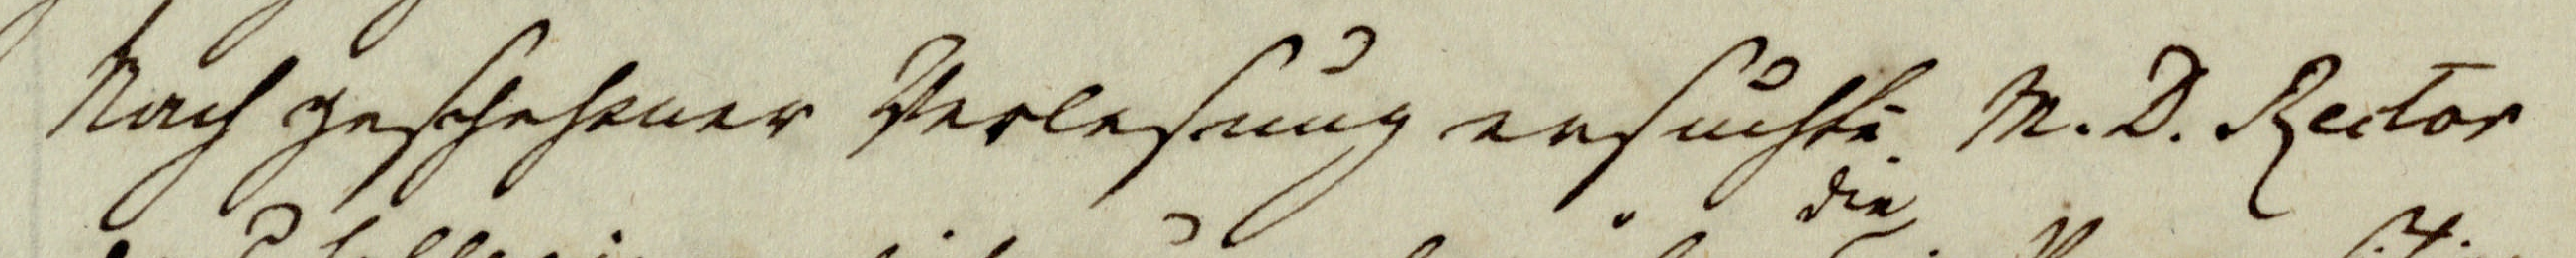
Nach geschehener Vorlesung ersuchte M. D. Rector
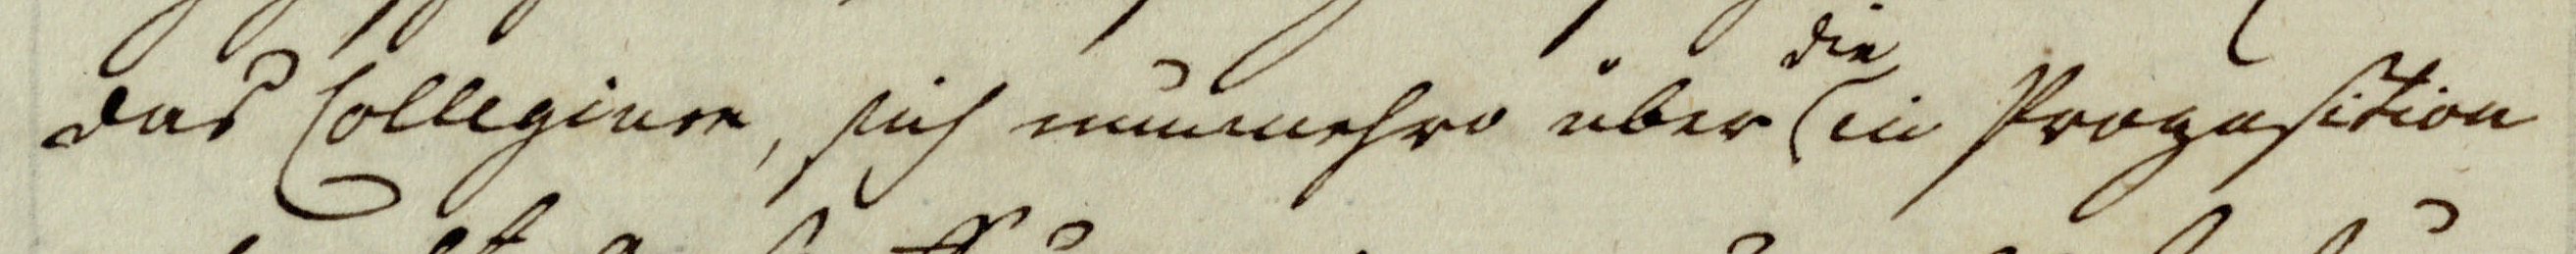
das Collegium, sich nunmehro über in Proposition
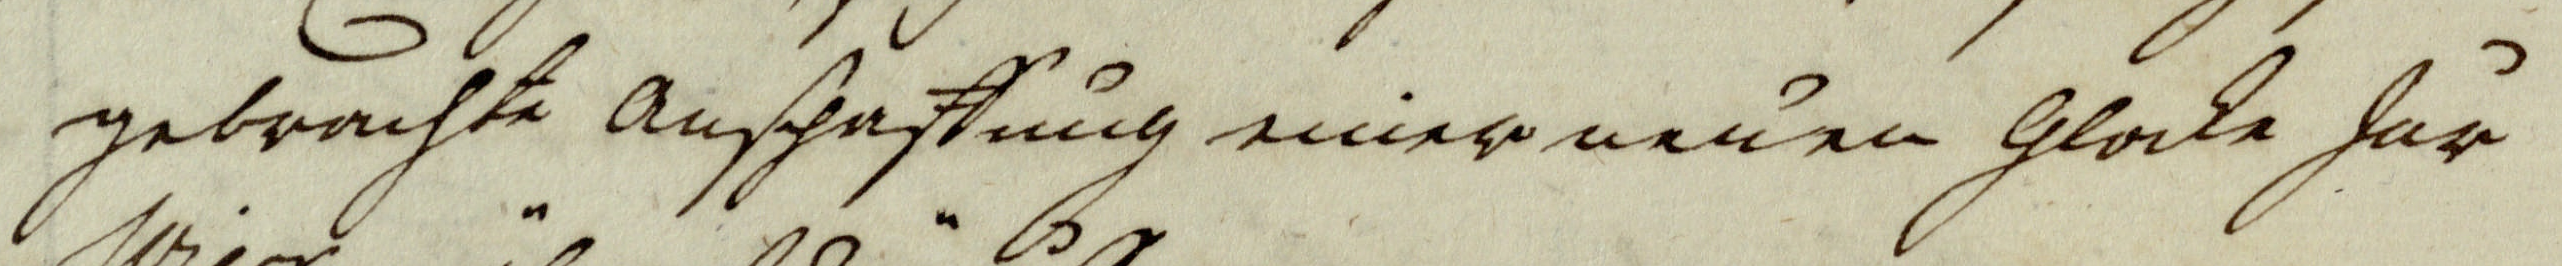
gebrachte Anschaffung einer neuen Glocke zur
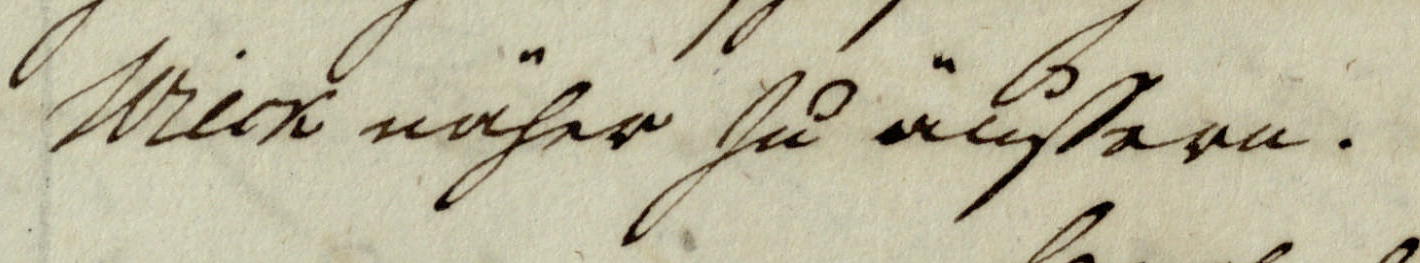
Wieck näher zu äussern.
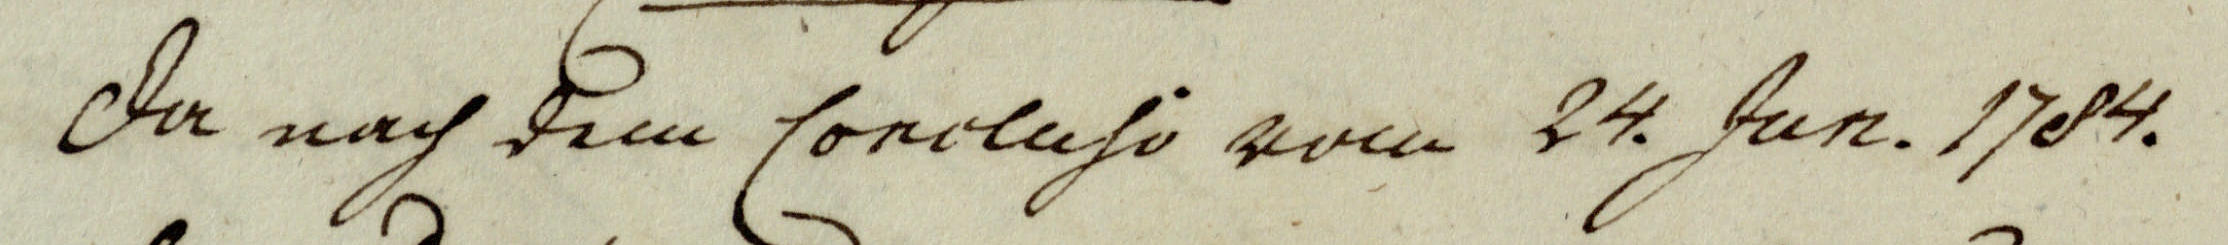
Da nach dem Concluso vom 24. Jun. 1784.
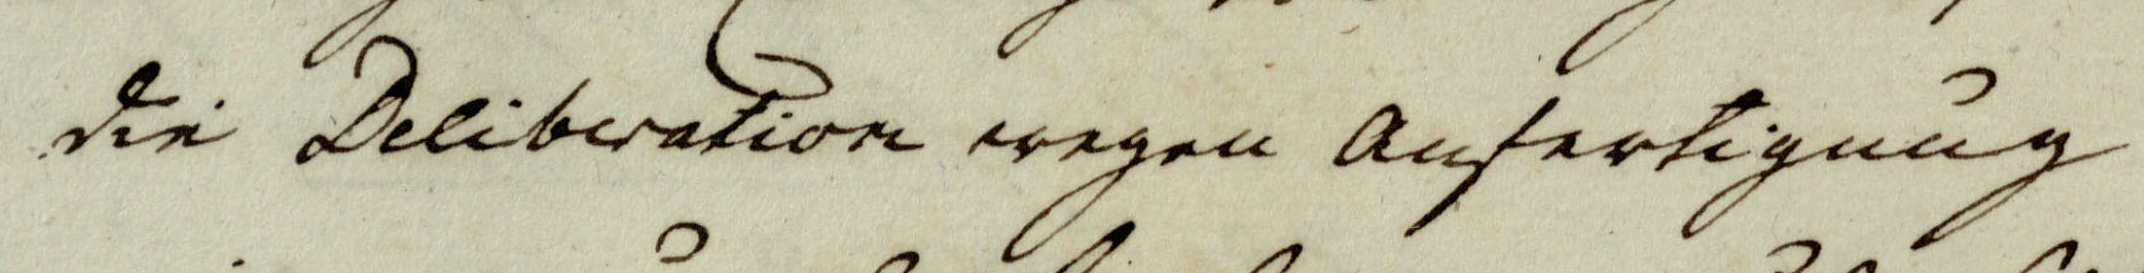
die Deliberation wegen Anfertigung
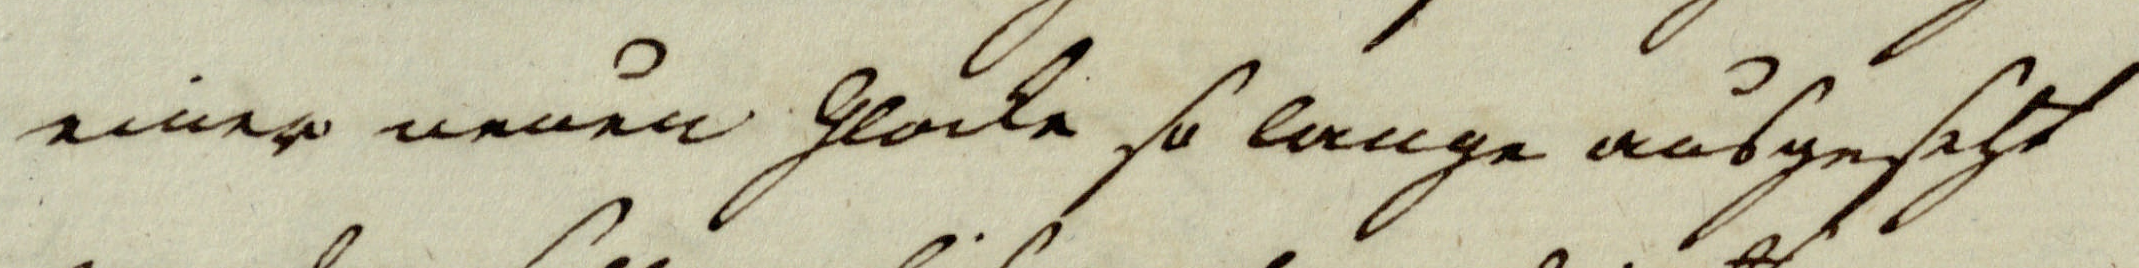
einer neuen Glocke so lange ausgesetzt
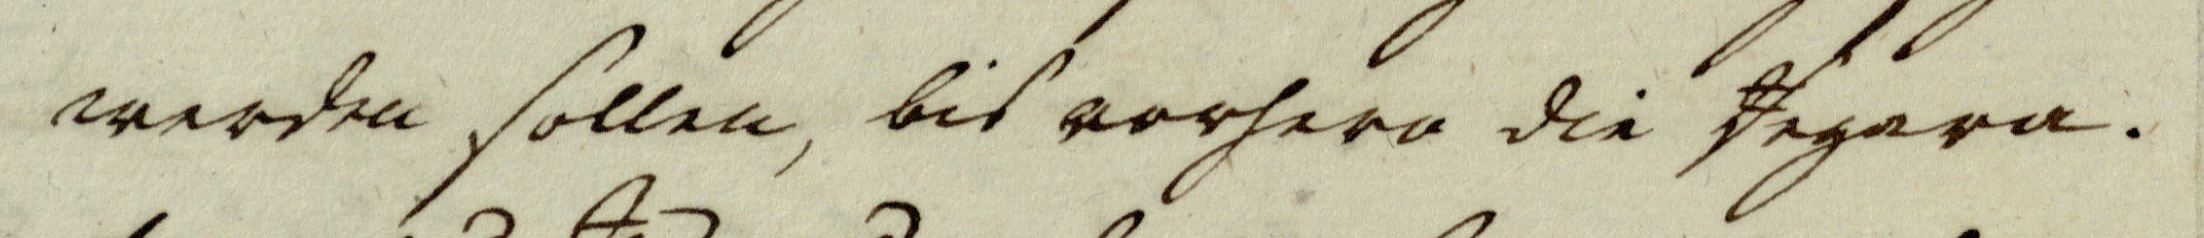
werden sollen, bis vorhero die Repara¬
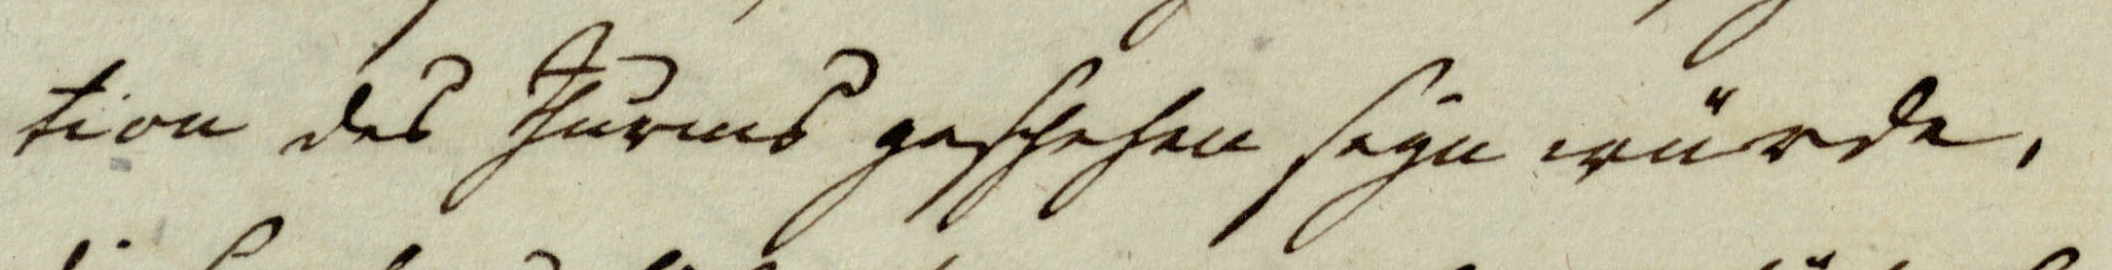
tion des Thurms geschehen seÿn würde,
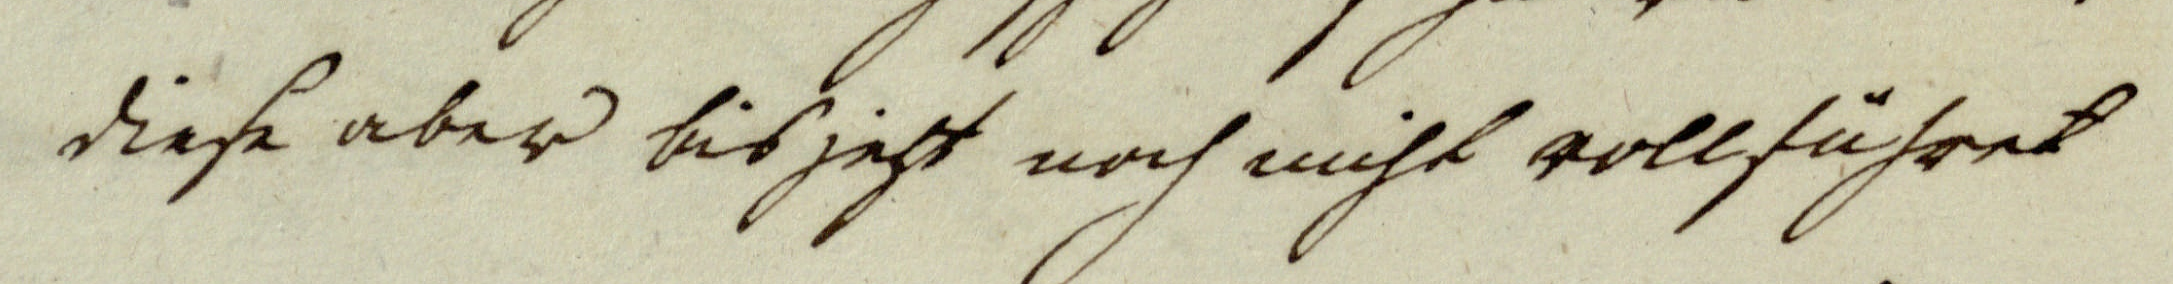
diese aber bis jetzt noch nicht vollführet
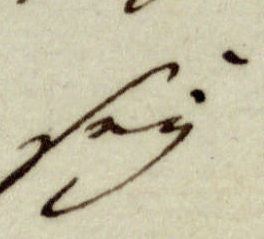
seÿ
